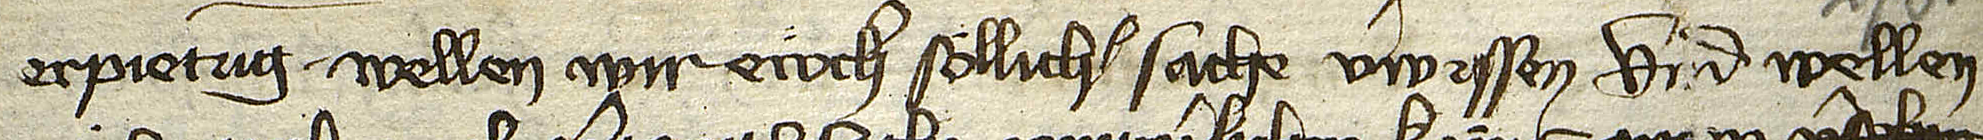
erpietug* . wellen wir eẅch ſöllich* ſache v*wiſſen Vnd wellen
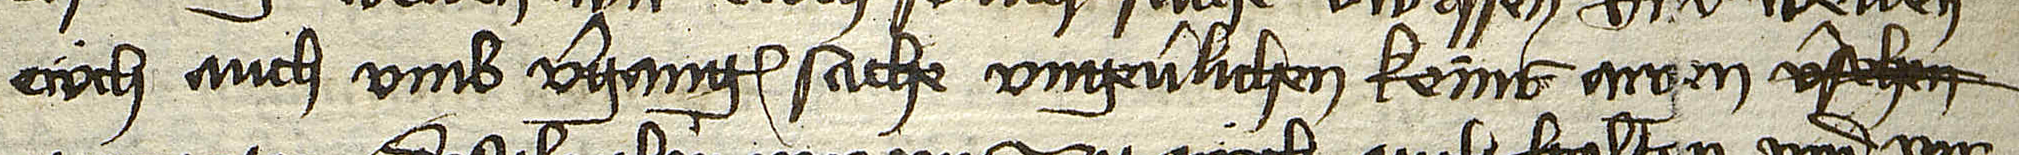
eẅch auch vmb v*gang* ſache vngeu*lichen keins argen v*ſehen
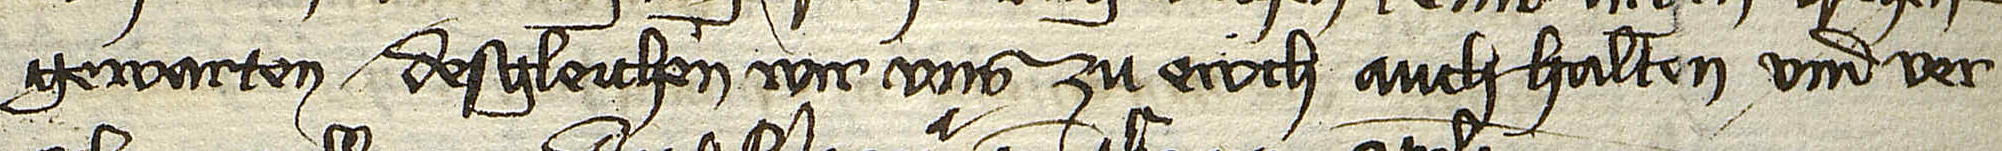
gewarten / Deſgleichen wir vns ʒu eẅch auch halten vnd ver
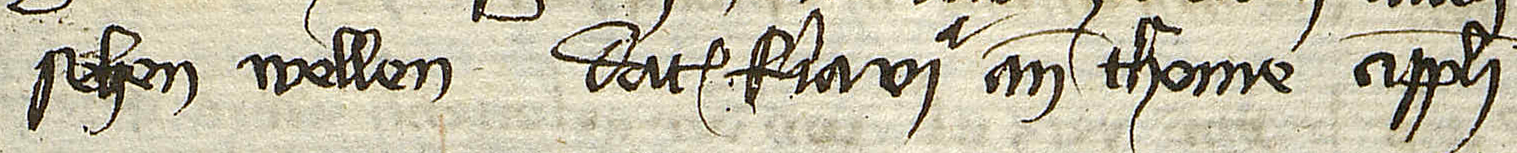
ſehen wellen Dat* fia* vi ante thome appli*
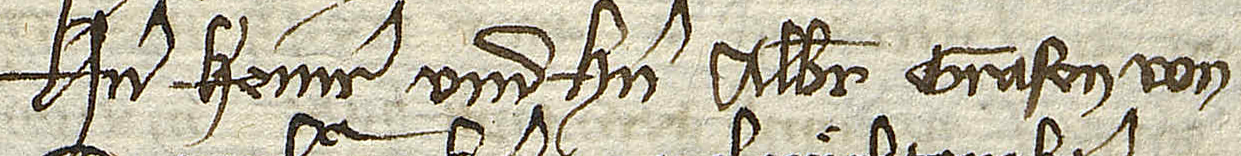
Hn* heinr* vnd h*n Albr* Grafen von
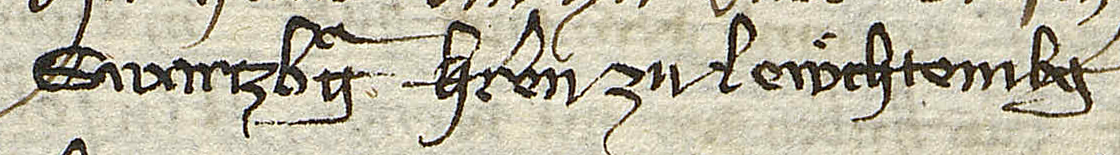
Swarcʒbg* h*ren ʒu leẅchtembg*
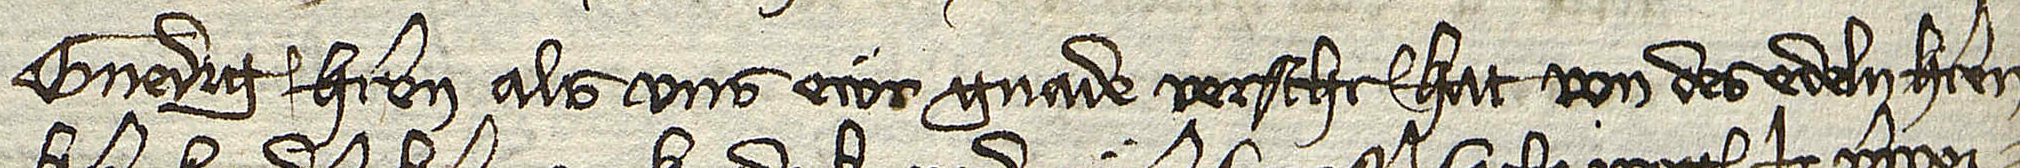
Gnedig* h*ren als vns eẅr gnade verſchr* hat von des edeln h*ren
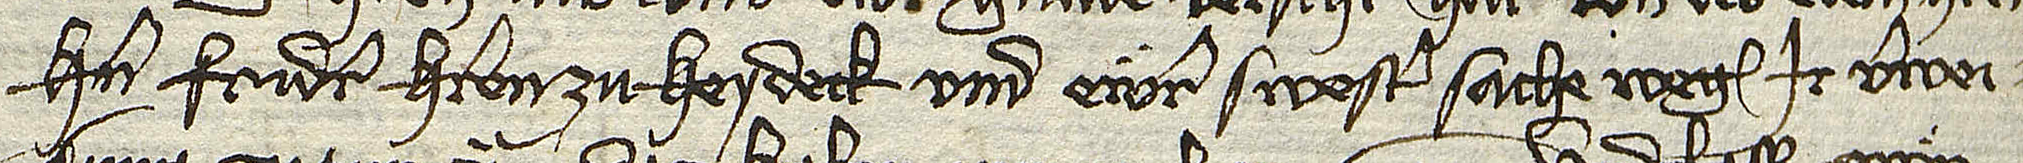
h*n fridr* h*ren ʒu heydeck vnd eẅr ſweſt* ſache weg* Ir v*wei =
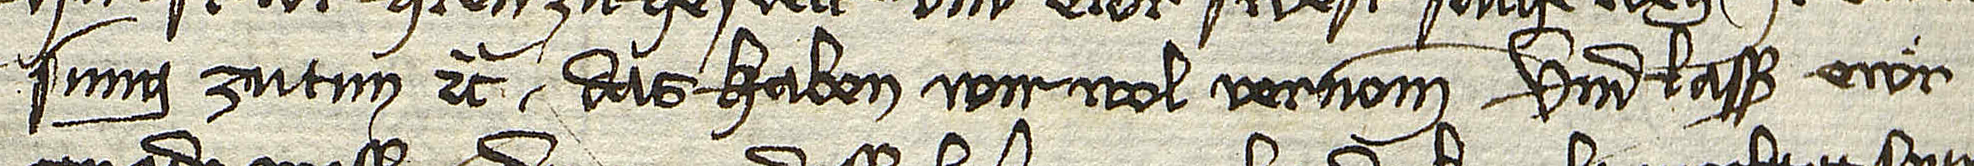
ſung ʒutun ec* / das haben wir wol vernom* Vnd laſſ* eẅr
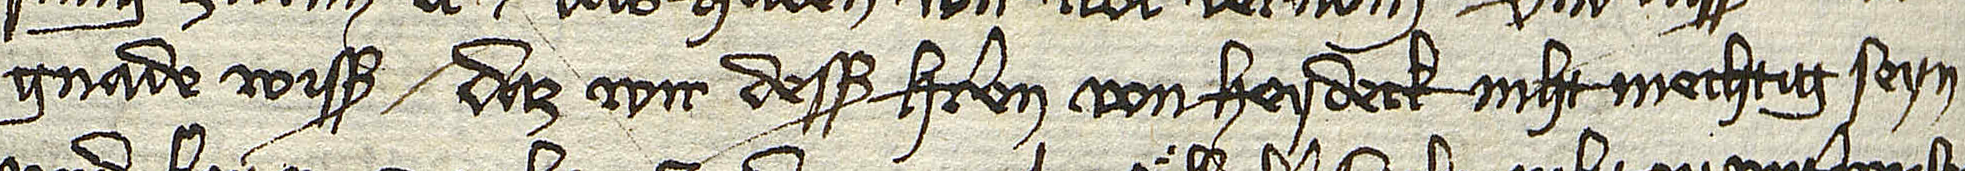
gnade wiſſ* / daʒ wir deſſ* h*ren von heydeck niht mechtik ſeyn
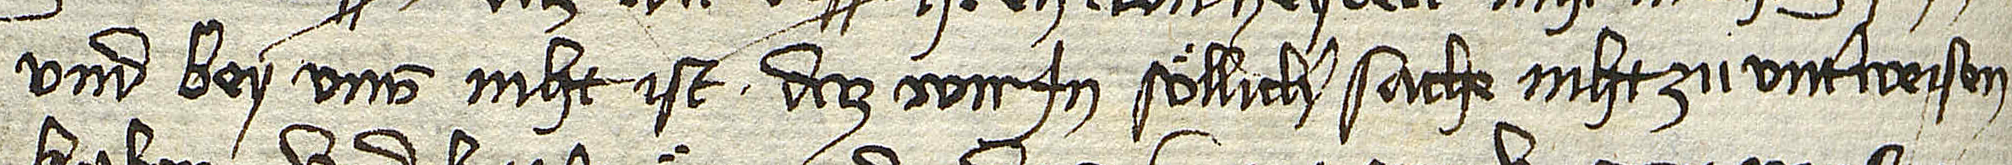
vnd bey vns niht iſt . daʒ wir In ſöllich* ſache niht ʒu vnt*weiſen
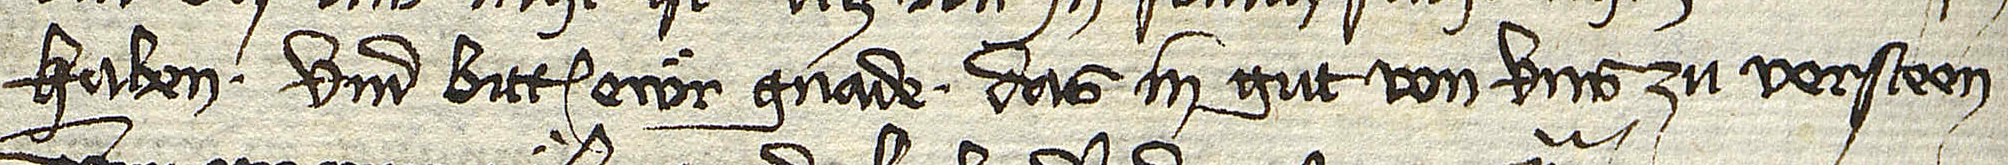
haben . Vnd bitt* eẅr gnade . das in gut von Vns ʒu verſteen
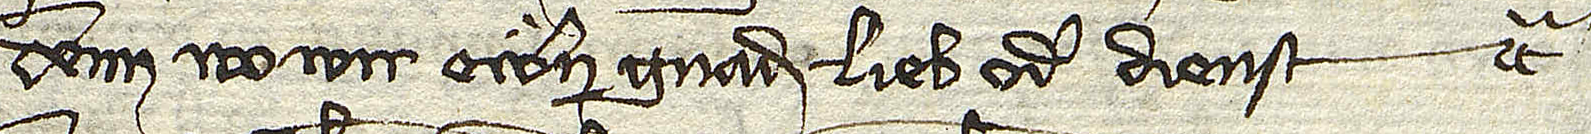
Denn wo wir eẅn* gnad* lieb od* dienſt ec*
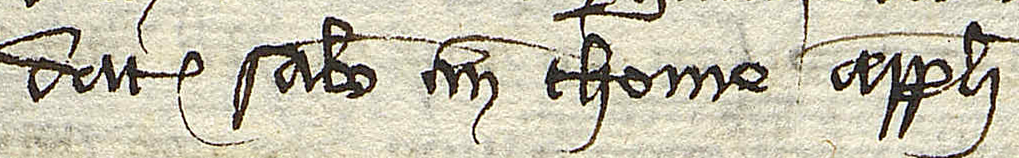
Dat* ſabo* an* thome appli*
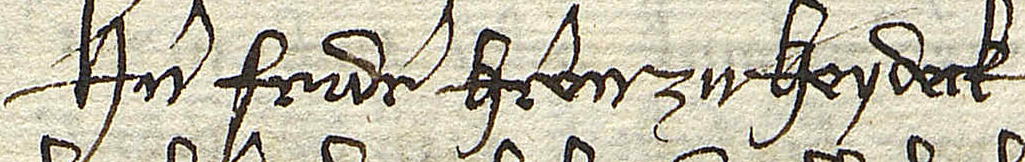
Hn* fridr* h*ren ʒu heydeck
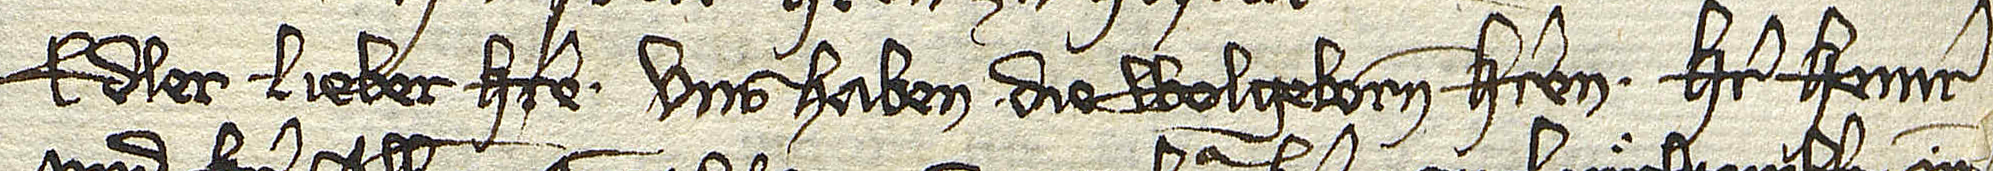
Edler lieber h*re . Vns haben die wolgeborn* h*ren . hr* heinr*
